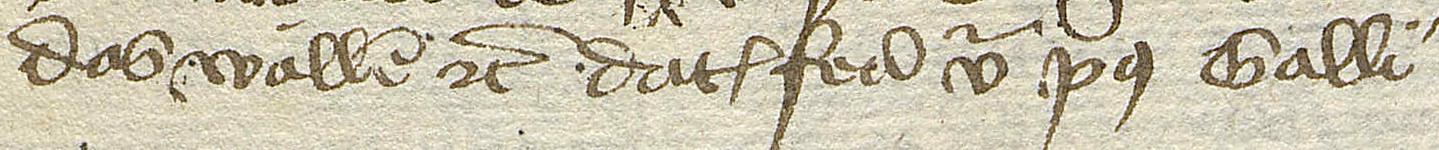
das wölle* ec* dat* fea* v* p* Galli
